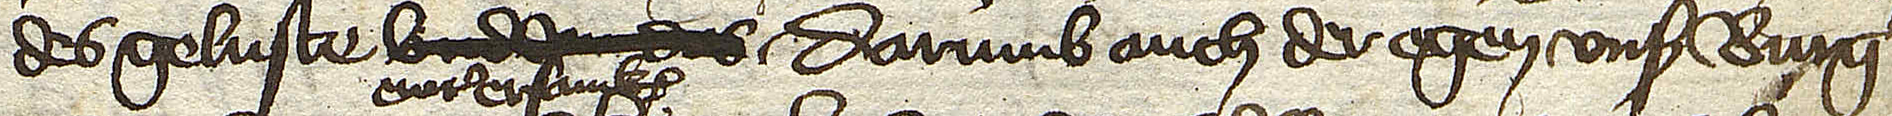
des geluſte vnd Im das / Darümb auch der egen* vnſ* Burg*
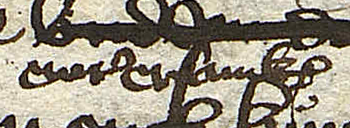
ewr* erſamk*
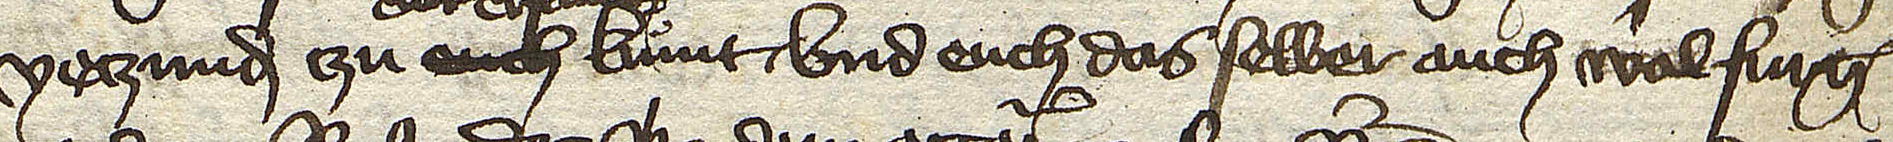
yecʒund* cʒu euch kümt / vnd euch das ſelber auch wol furg*
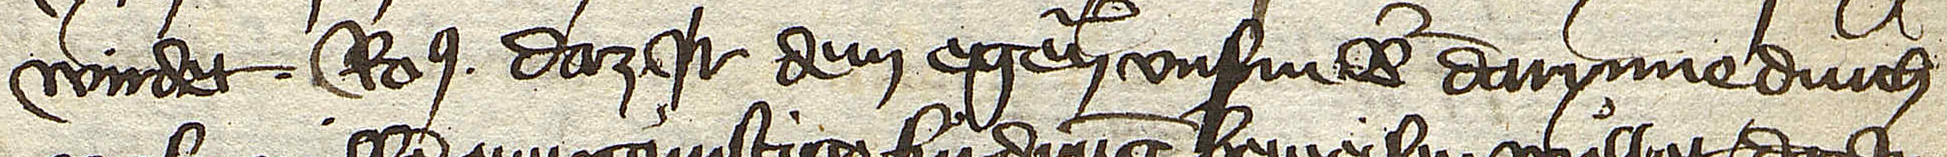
wirdet . Ro* . Daʒ Ir dem egen* vnſ*m B* darynne durch
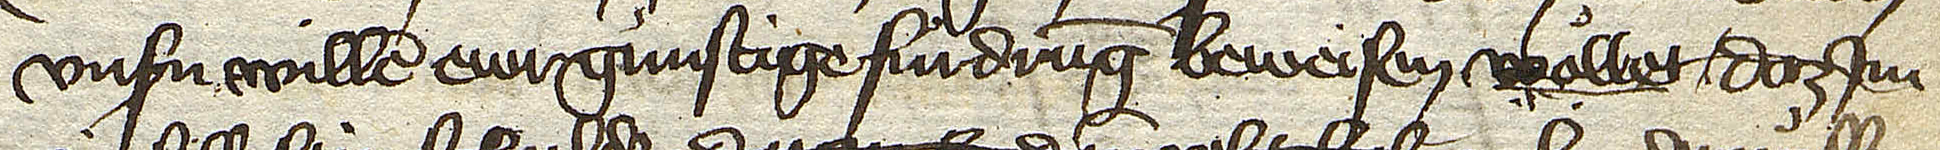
vnſ*n wille* ewr günſtige fürdru*g beweiſen wöllet / daʒ Im
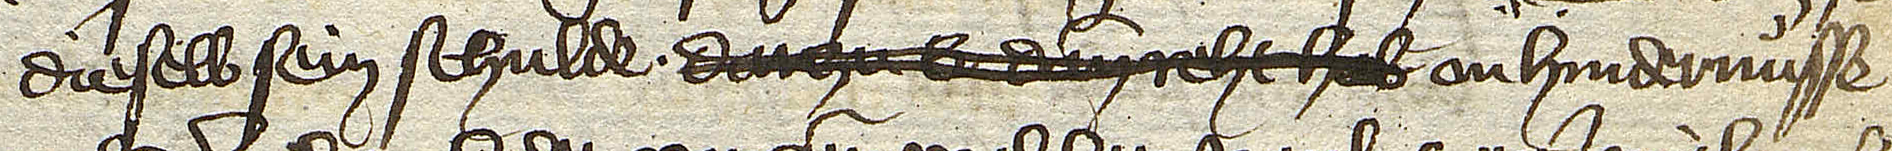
dieſelb ſein ſchulde . darcʒu Er dan* reht hab on hindernüſſe
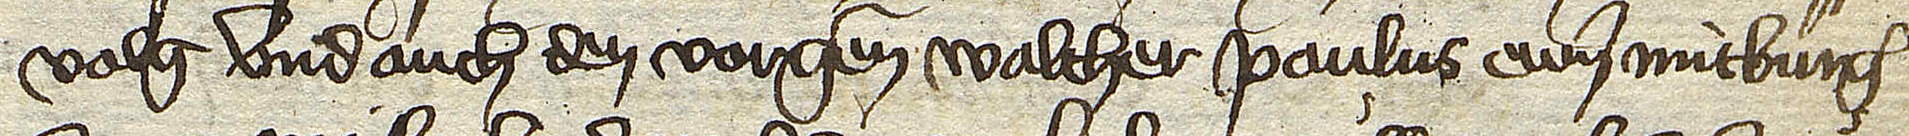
volg vnd auch den vorgen* walther paulus ew*n mitburg*
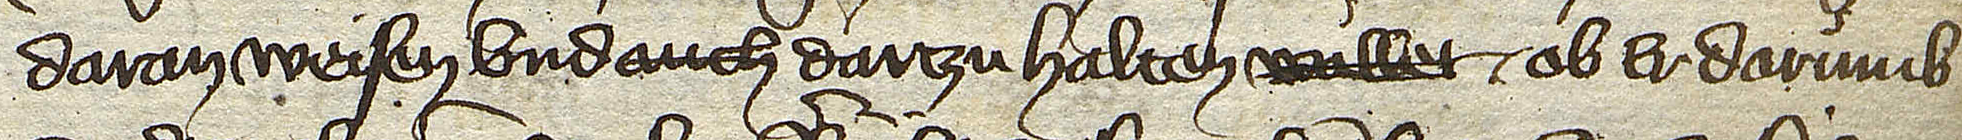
daran weiſen vnd auch darcʒu halten wöllet / ob Er darümb
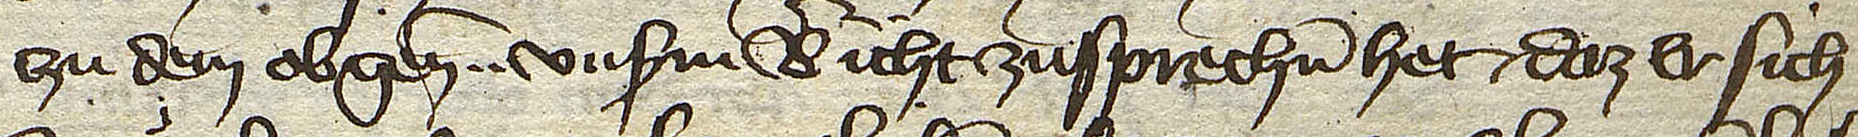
cʒu dem obgen* ~ vnſ*m B* icht cʒuſprechn* het / daʒ Er ſich
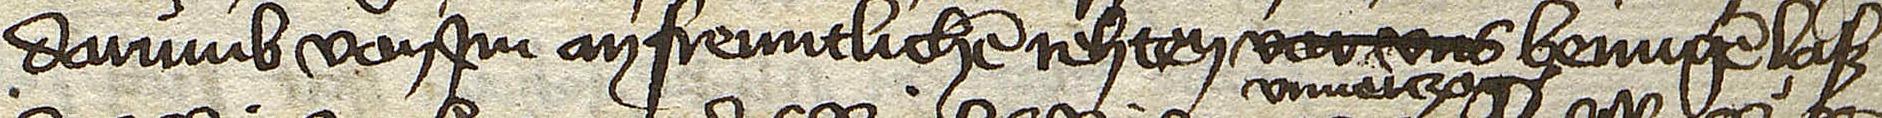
darümb von Im an freuntliche* rehten vor vns benuge* laſʒ
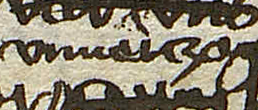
vnuercʒog*
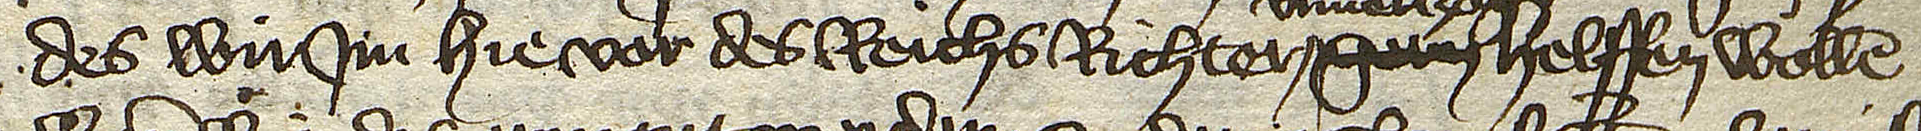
des wir Im hie vor des Reichs Richter gern helffen wölle*
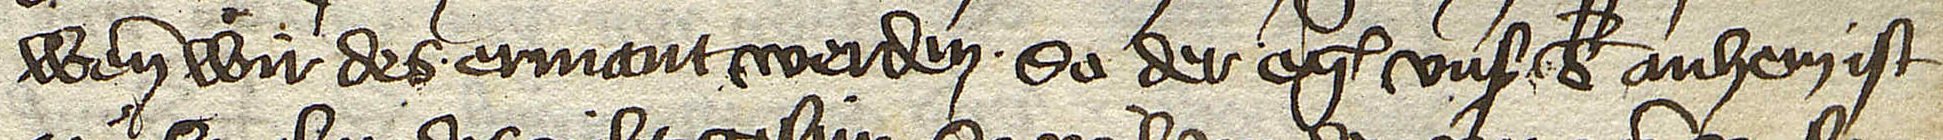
wen* wir des ermant werden . So der eg* vnſ* B* anheim iſt
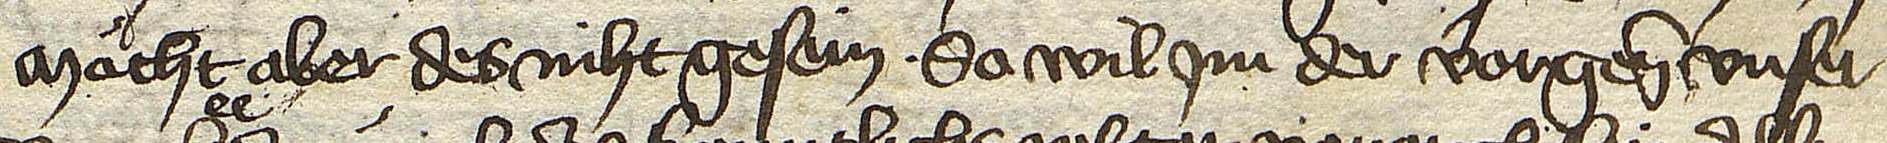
Möcht aber des niht geſein . So wil Im der vorgen* vnſer
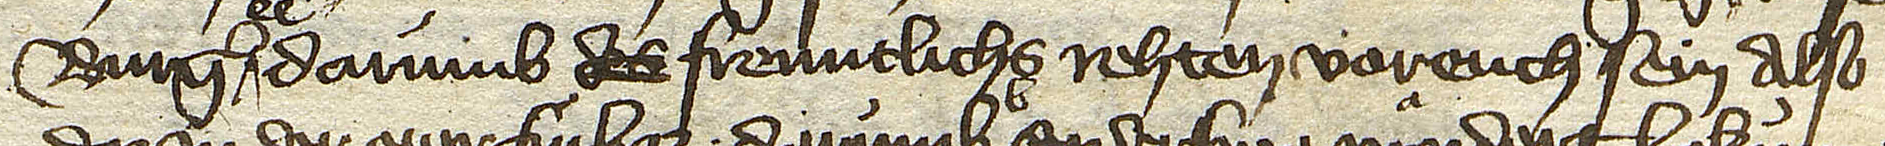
Burg* darümb des freuntlichs rehten vor euch ſein Alſo
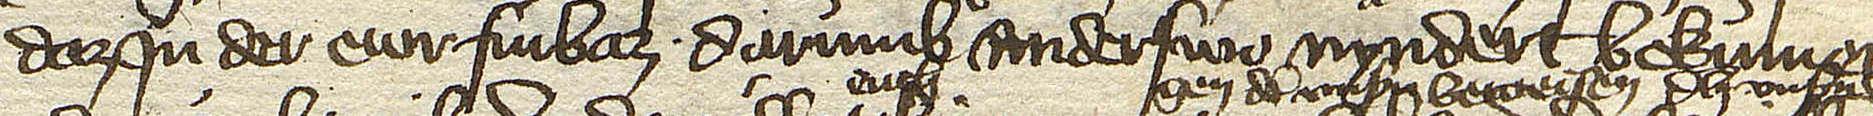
daʒ In der ewr fürbaʒ . darümb anderſwo nyndert bekümer
